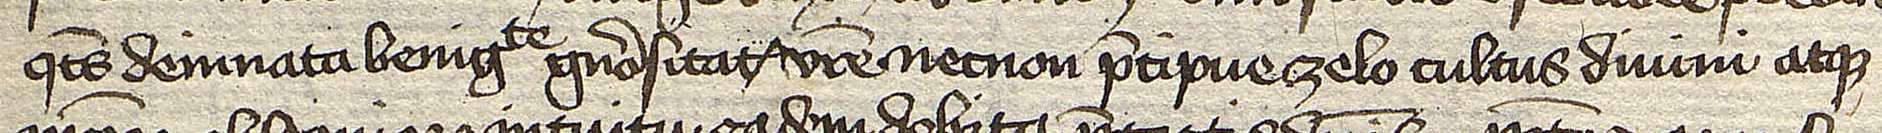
q*t*s de innata benig* g*n*oſitat* v*re . necnon p*cipue ʒelo cultus diuini atq*
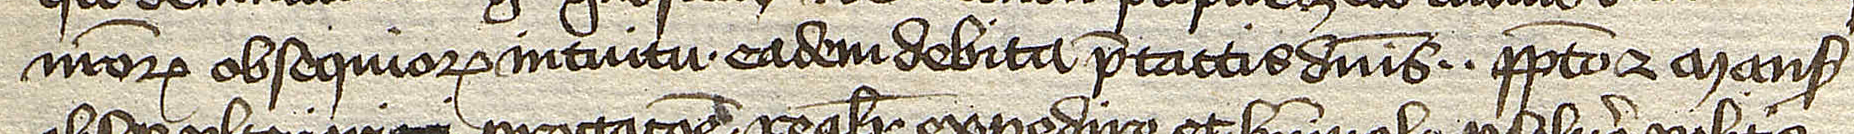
n*ror* obſequior* intuitu . eadem debita p*tactis d*nis . . p*p* @ Manſ*
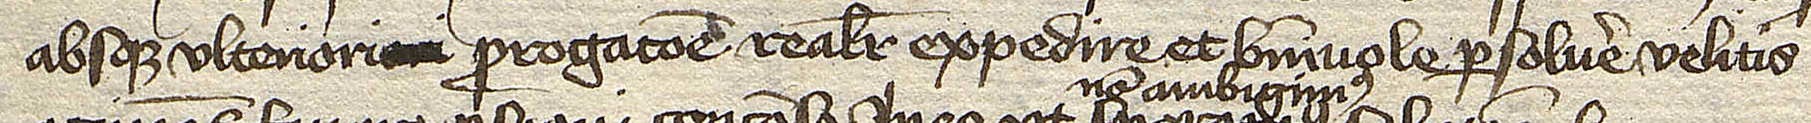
abſq* vlterioriori p*rogac*o*e real*r expedire et b*niuole p*ſolue* velitis
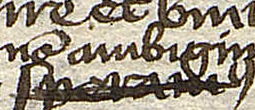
no* ambigim*
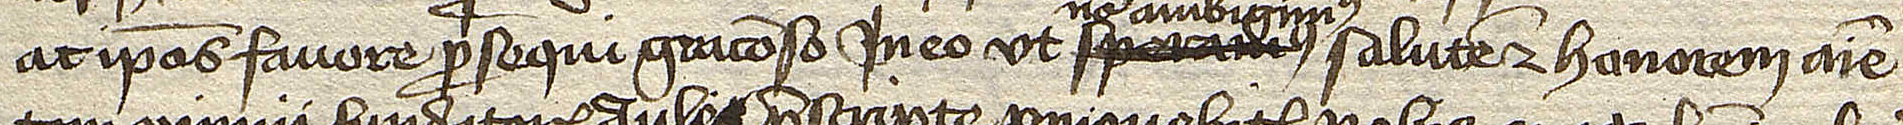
ac ip*os fauore p*ſequi grac*oſo Ineo vt ſperabt* ſalute* @ honorem a*ie
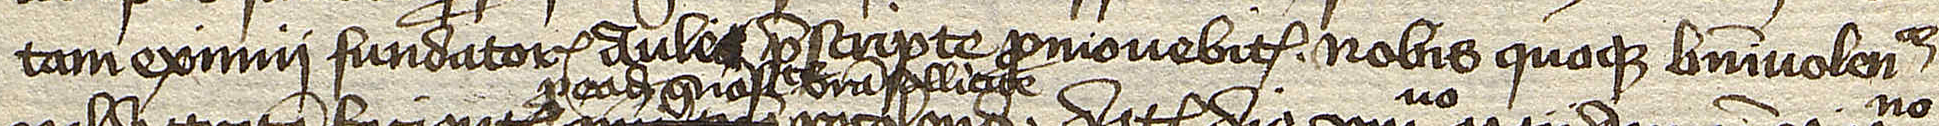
tam eximii fundator* Aule p*ſcripte p*mouebit* . Nobis quoq* b*niuolen*
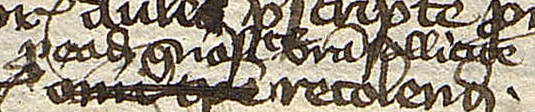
p* ead* gnoſ* v*ra ſollicue
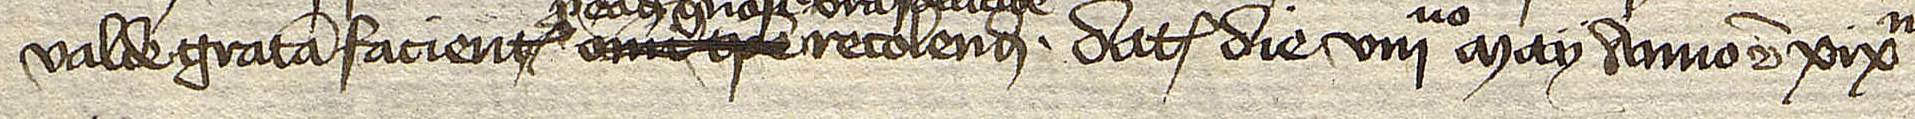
valde grata* facient* omi* tpe* recolend* . Dat* die viii* May Anno ec* xix*
